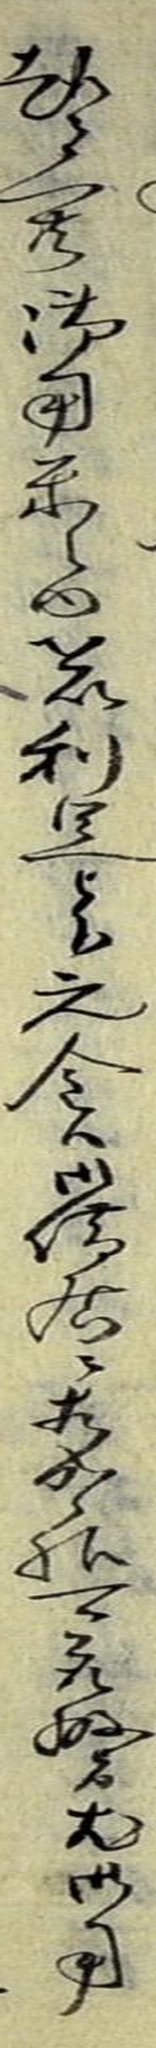趣に候へ共御用米之内を以利足被下元金は御借居に相成候様可取扱旨尤御用
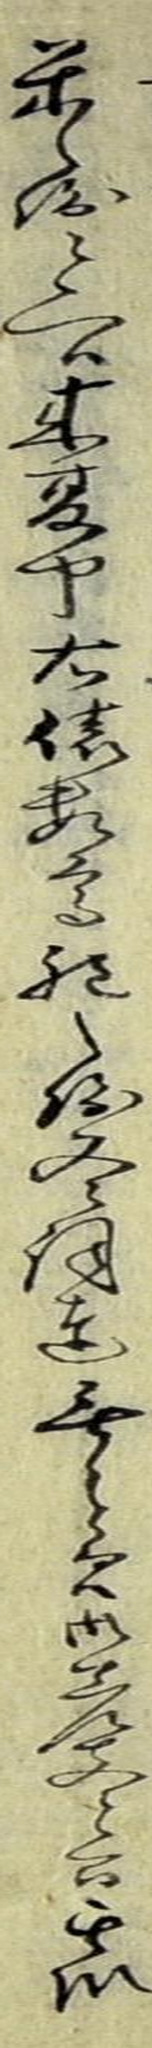米之儀に候へは来夏中右俵数高程之儀又々調達無之候而は御差支候間其段
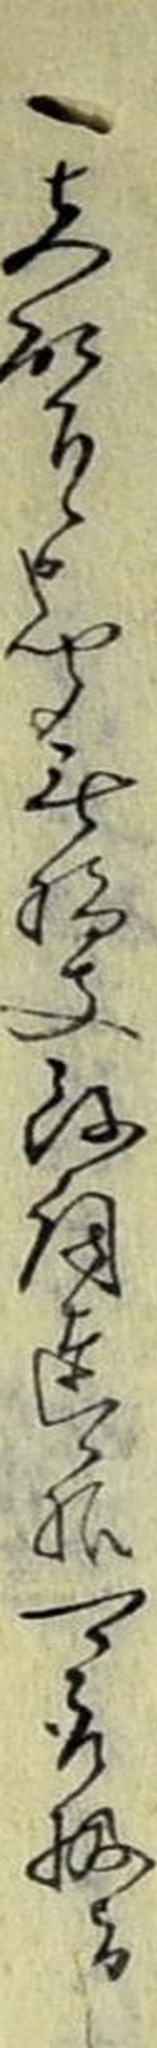支配下へ申聞無指支致調達候様可取扱旨
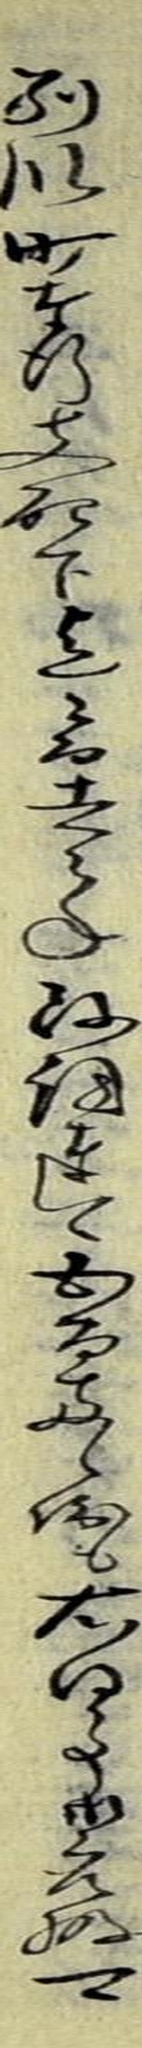別段町奉行支配下迄に而去々年致調達候五百両之儀も右同事御取扱可
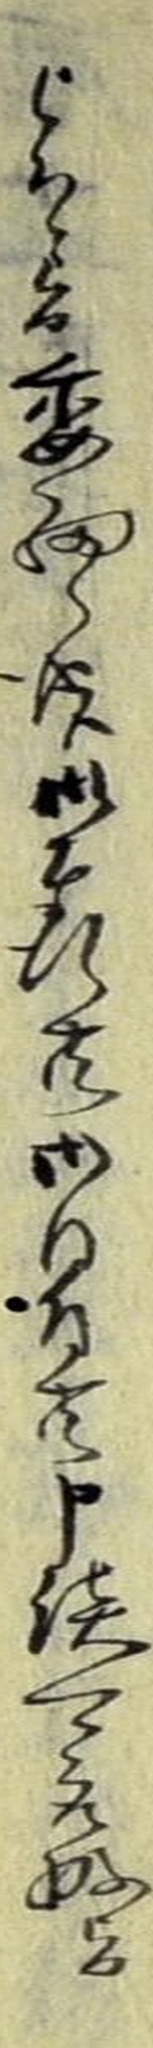被下旨委細之儀は御奉行共御目付共申談可取扱旨
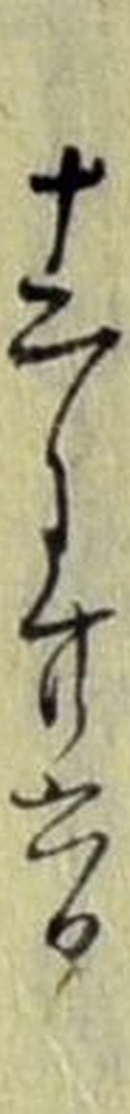十二月廿六日

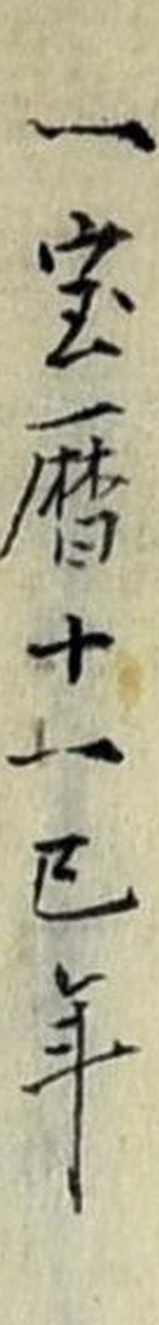一宝暦十一巳年
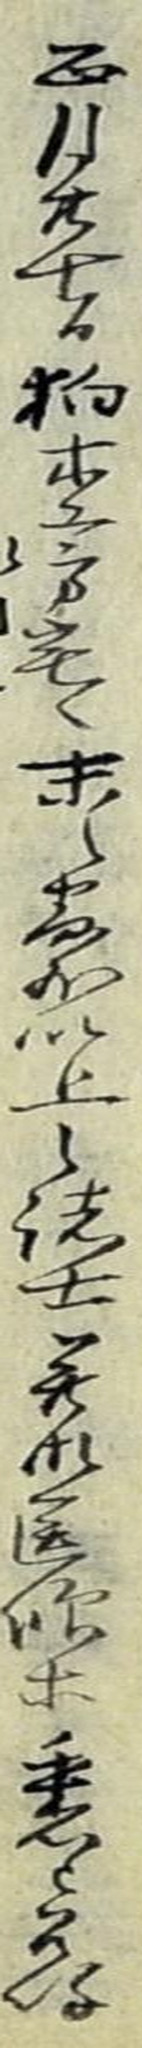正月廿七日狛杢方宅へ末之番外以上之諸士并御医師等悉被召呼
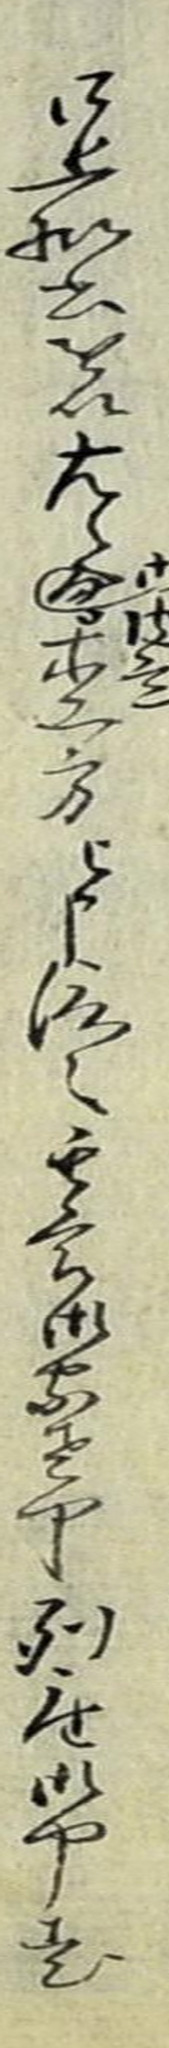口上扣書を以左之通◦御内意杢方被申渡之其節御家老中列座御中老
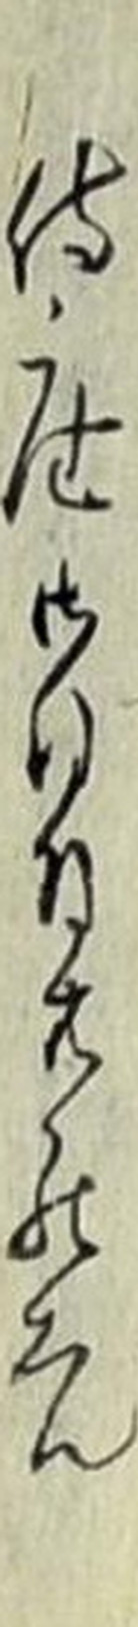侍座御目付共罷出る
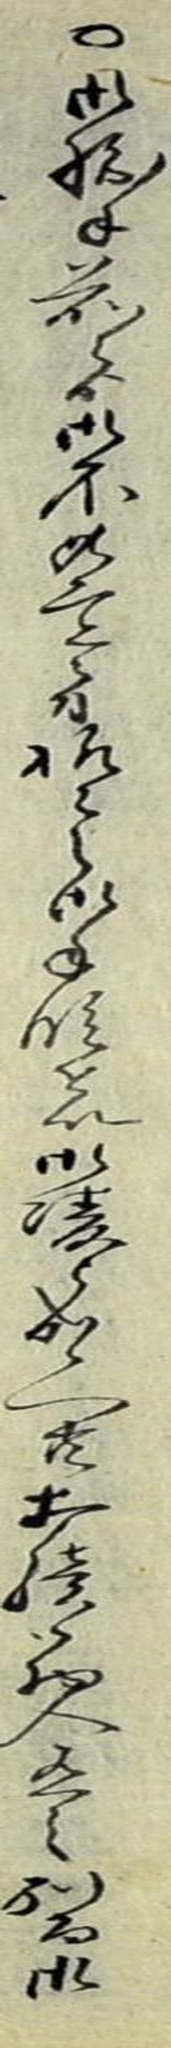〇御勝手前々ゟ御不如意に付様々之御手段を以御凌被成候へ共打続御物入有之別而御
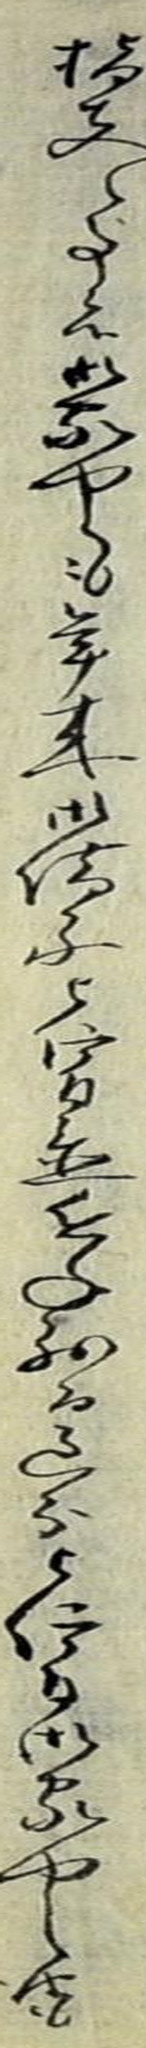指支之事に候御家中へも年来御借米被仰付置近年別而過分被仰付御家中之儀も
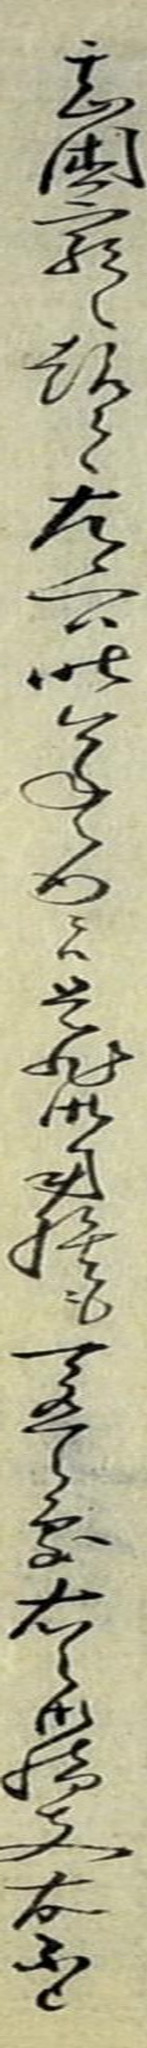甚困窮之趣に候左候へは昨今年之内には是非御用捨も可有之候処右之御指支故不被
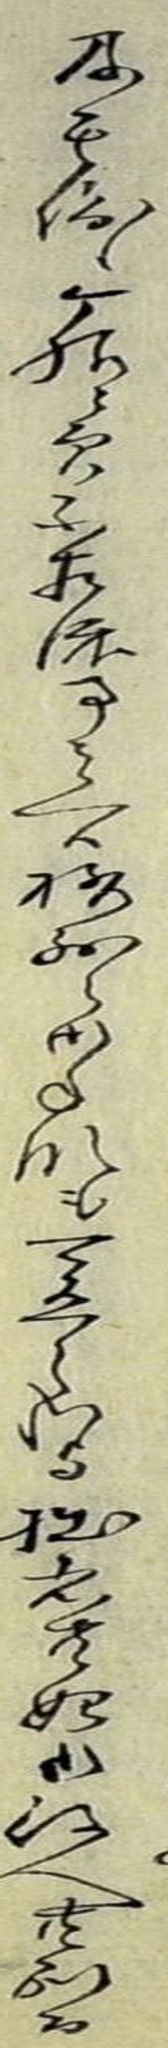及其儀候ケ様に而は不済事に候へは格別之御手段も可有之哉と拙者共始御役人共別而
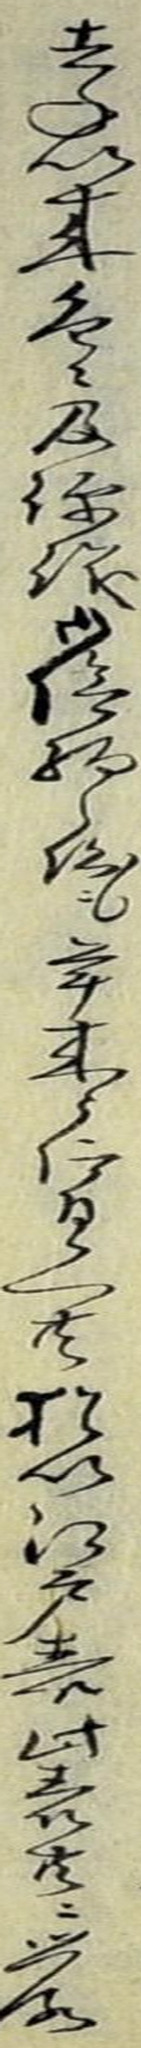去年以来色々及評議御倹約之儀も年来被仰付候へ共猶以江戸表此表共に厳
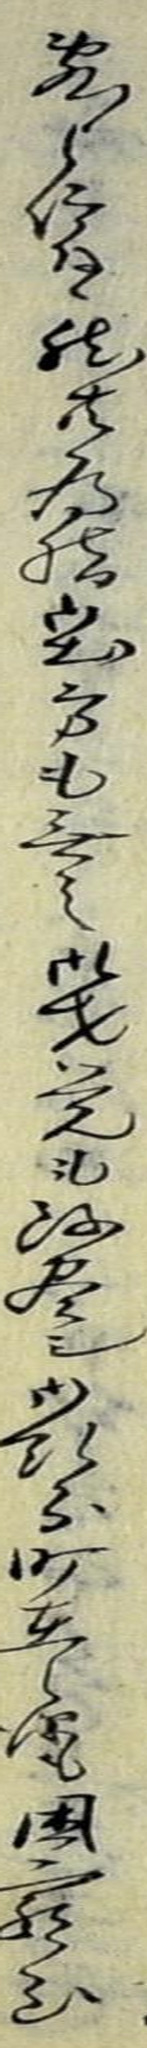敷被仰付候然共為指御出方も無之御才覚も致尽し御領分町在之儀も困窮至
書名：命令之部 二
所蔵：福井県文書館 Fukui Prefectural Archives
